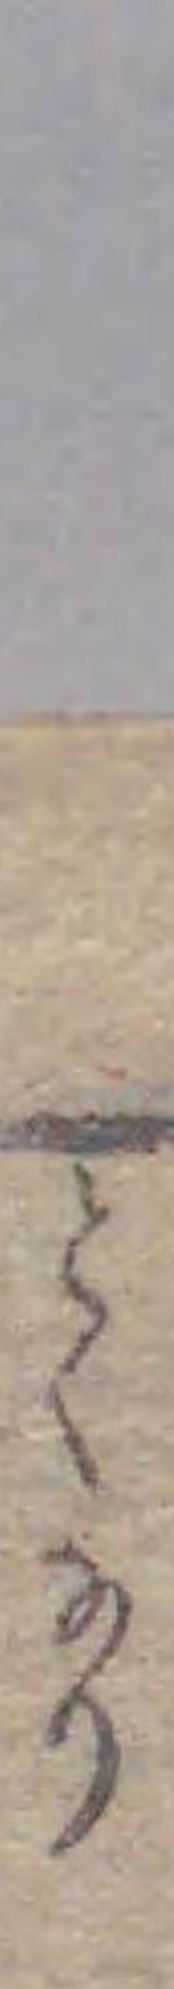とくなり
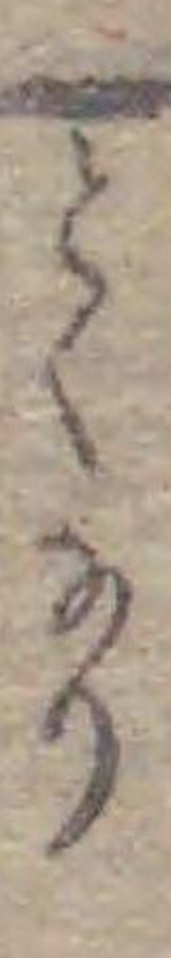とくなり
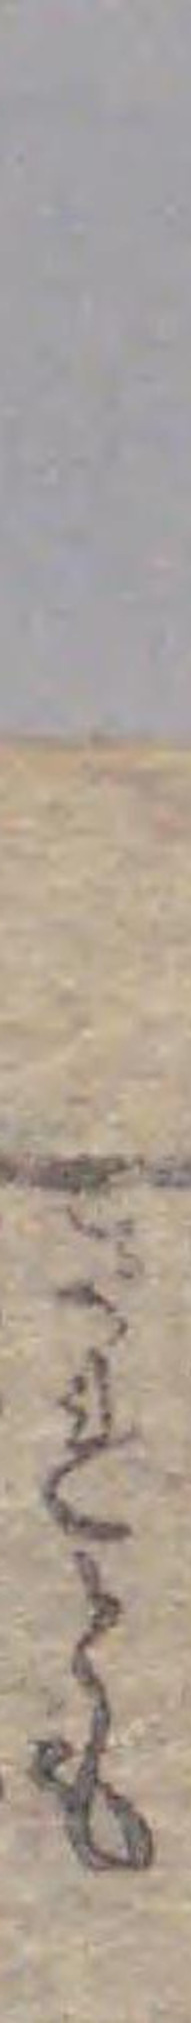されとも
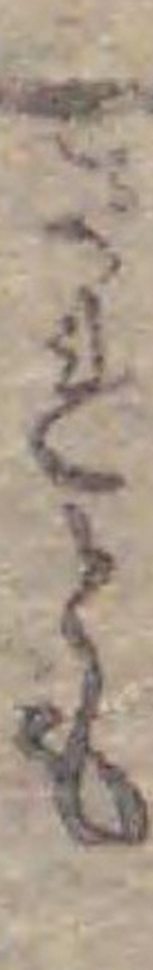されとも
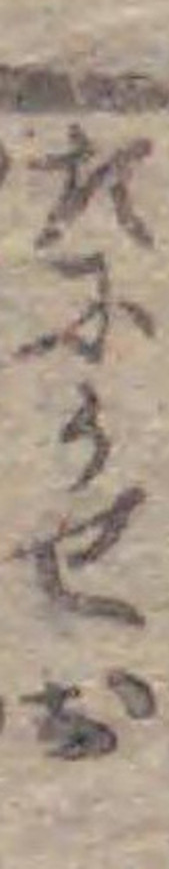たにかせお
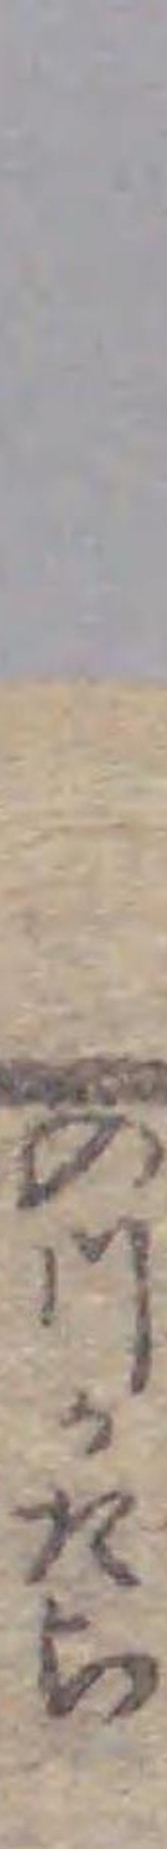の川かたち
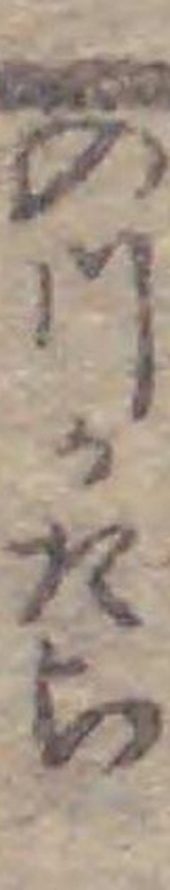の川かたち
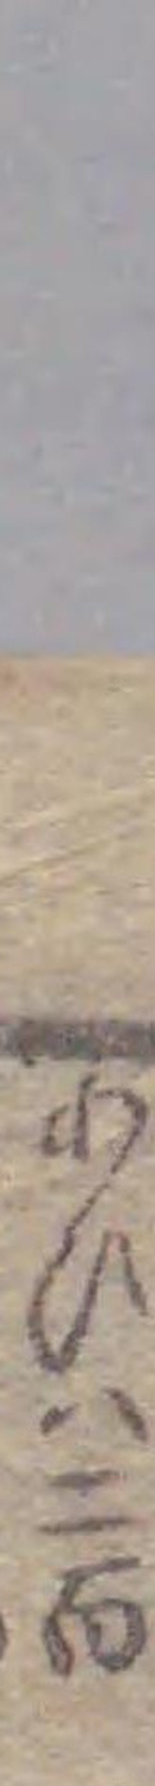あひは二百
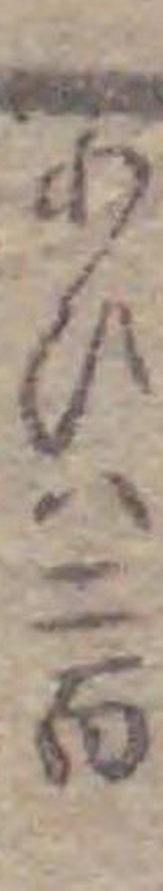あひは二百
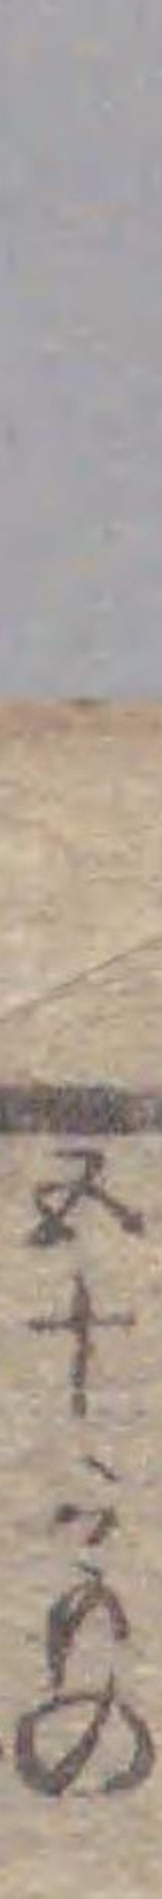五十分もの
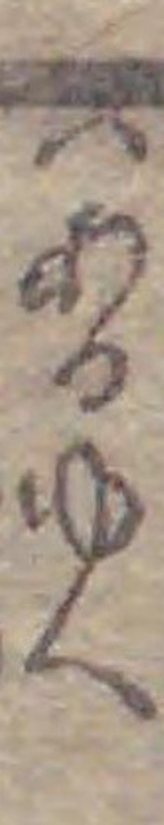はあるゆへ
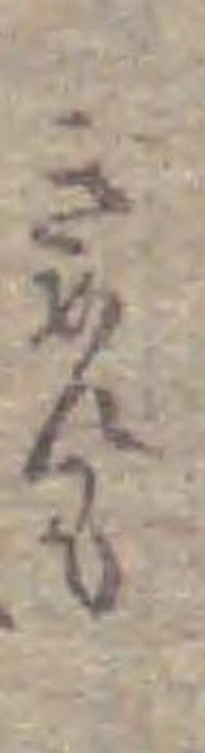きめんも
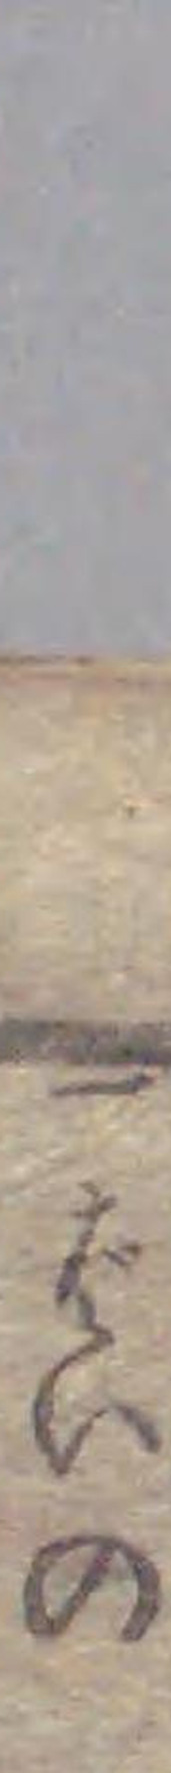一ばいの
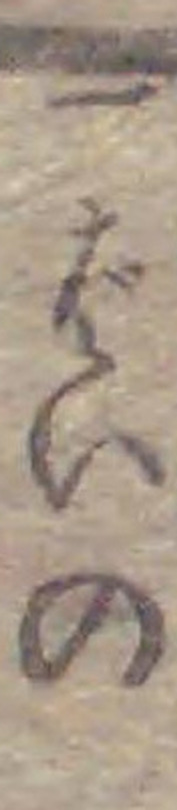一ばいの
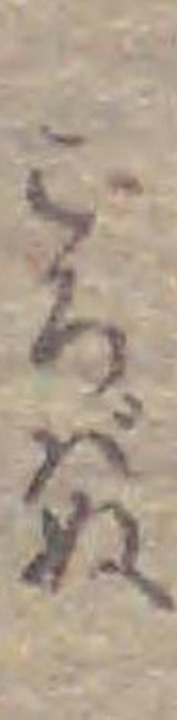ころばぬ
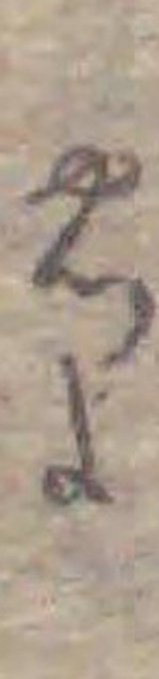やつよ
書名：紺屋百物語 : 3巻
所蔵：国立国会図書館 National Diet Library, JAPAN
